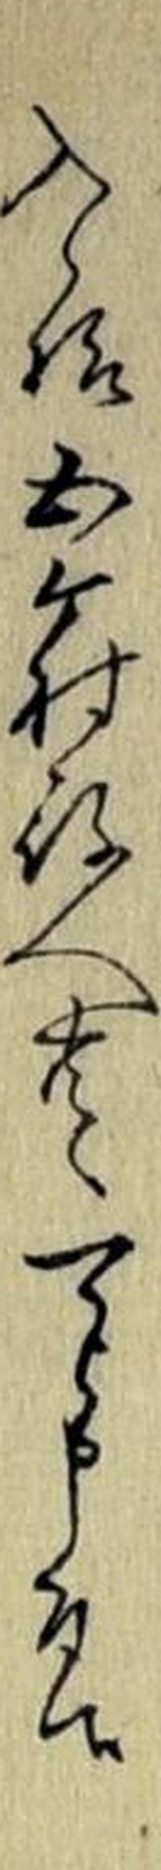入候様五ケ村役人共へ可被申付候
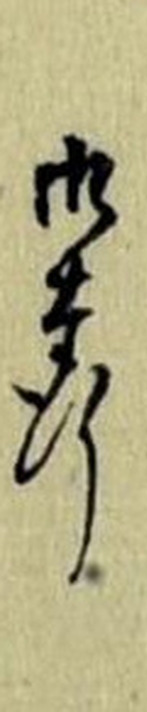御奉行
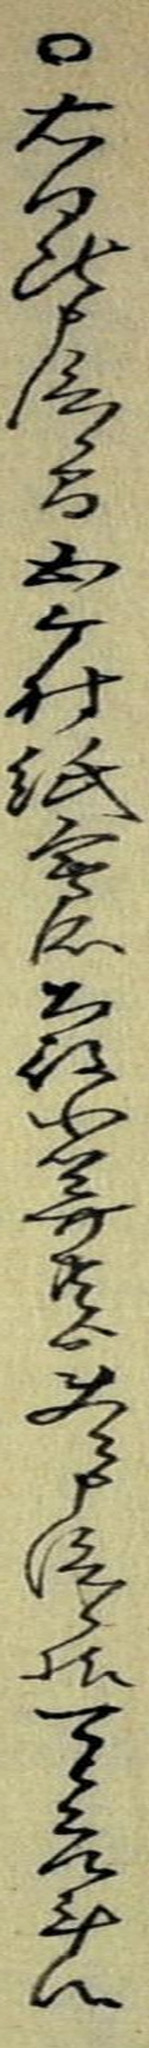〇右同断申渡候間五ケ村紙会所出役小算共ゟ夫々申渡候様可被取計候
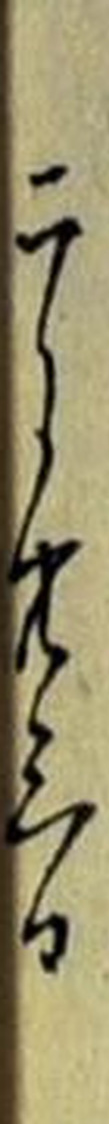二月廿三日
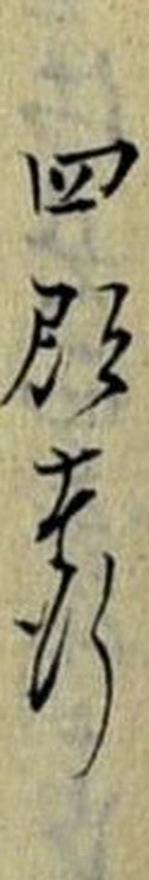四郡奉行
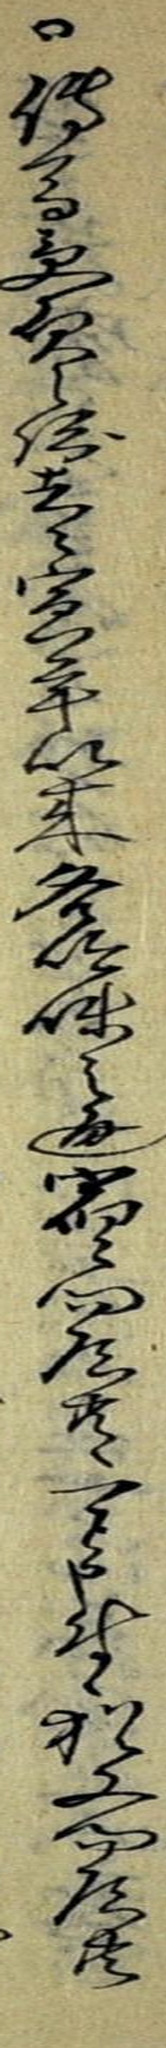〇伝馬受負之儀去々寅年以来各吟味之通宿々問屋共へ可被申付候猶又問屋共
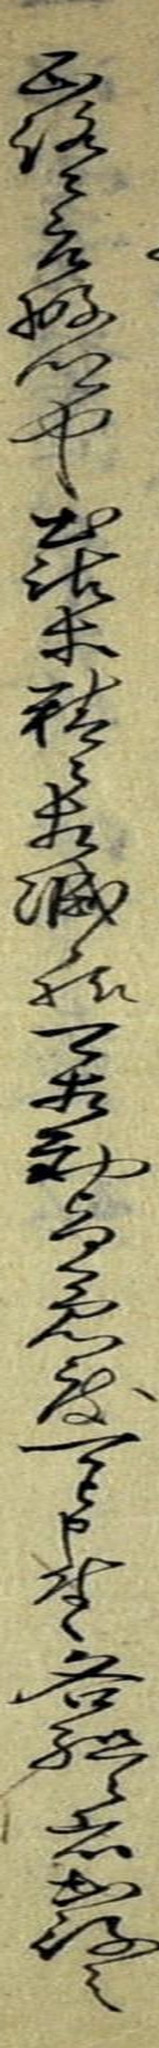正路ニ取扱郷中出銀等精々相減候様可相勤旨急度可被申付候各組之者出役之
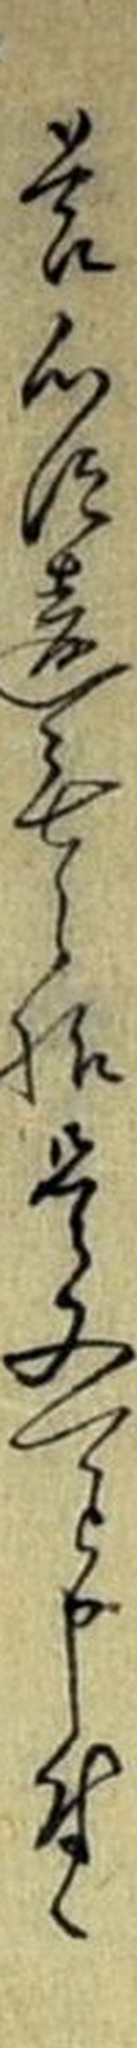節心得違無之様是又可被申付候
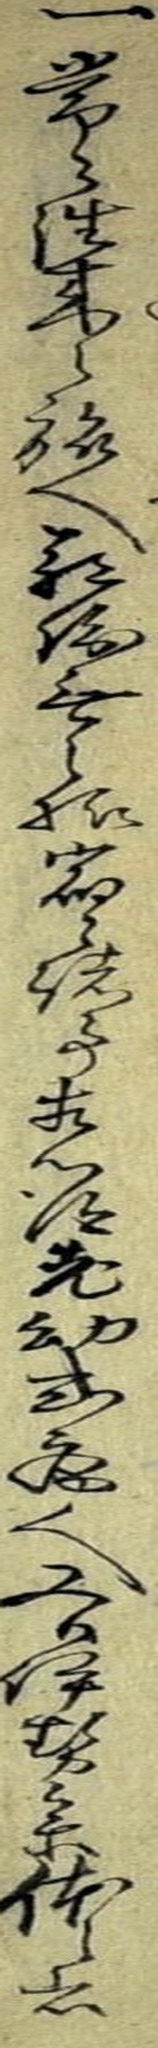一常々往来之旅人難儀無之様宿々諸事相心得老幼或病人又ハ伊勢参体之者
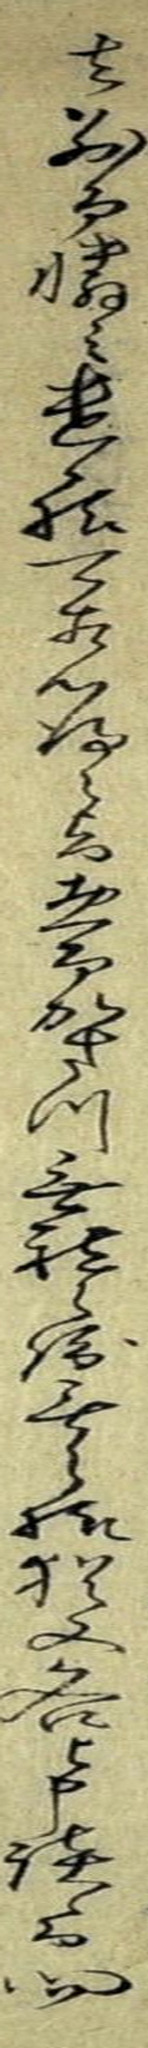者別而憐ミ遣候様可相心得候旨惣而かさつ無礼之儀無之様猶又各被申談候而問
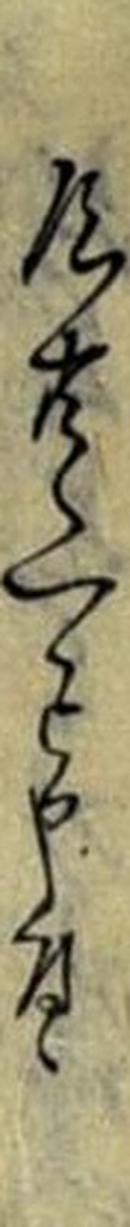屋共へ可被申付候
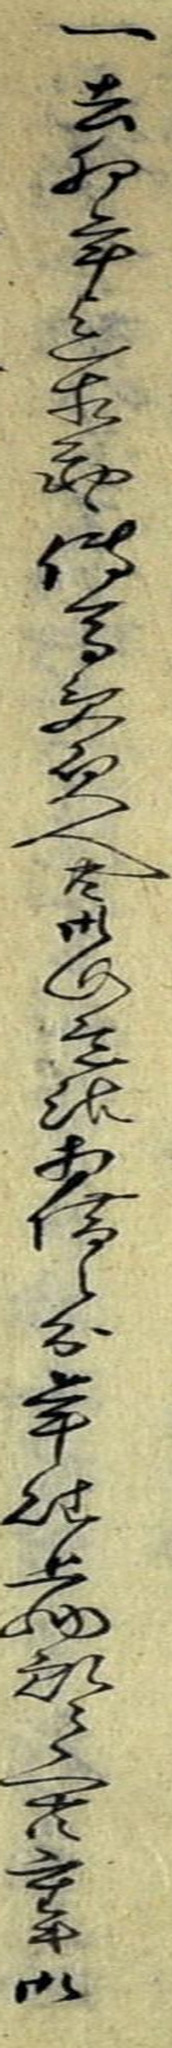一去卯年迄相勤候伝馬受負人共御趣意銀拝借之分年賦上納願ニ候へ共重キ御
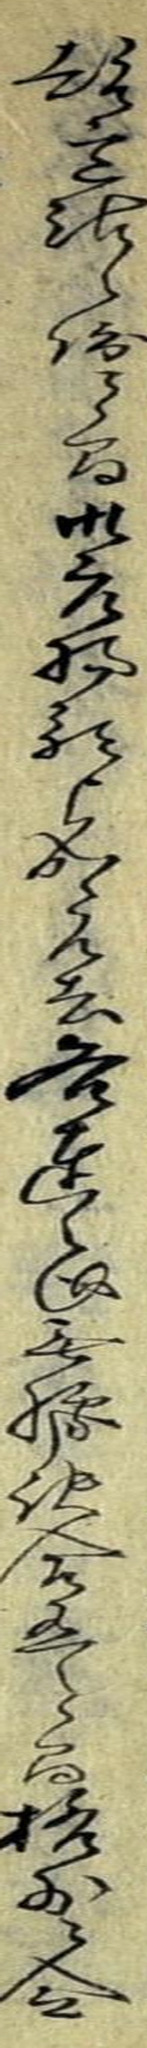趣意銀之儀ニ候間御取揚難被成候乍去各達之趣無拠訳合有之候間格別ニ令
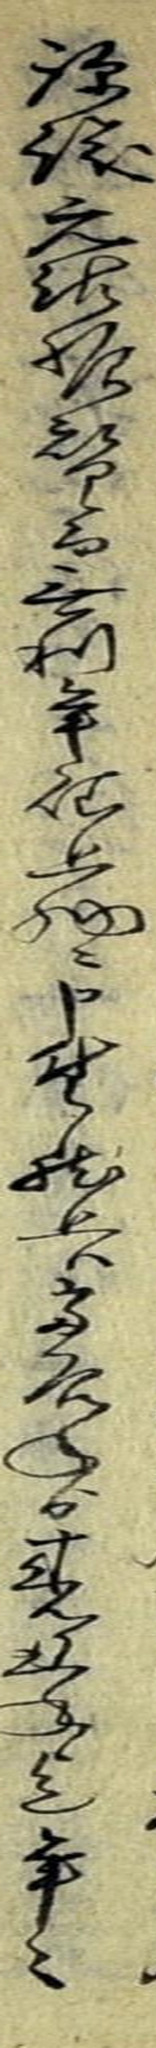評議元銀振替候而無利年賦上納ニ申付候然上ハ当辰年ゟ来ル丑年迄年々
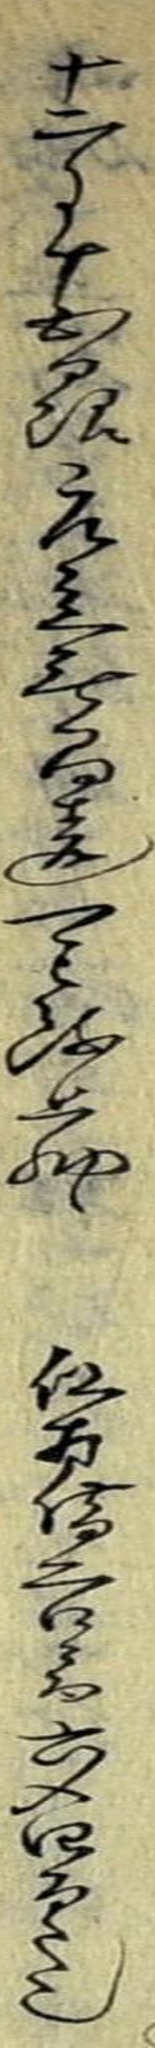十二月十五日限取立無間違可被致上納候但拝借ニ口ニ而六貫四百匁也
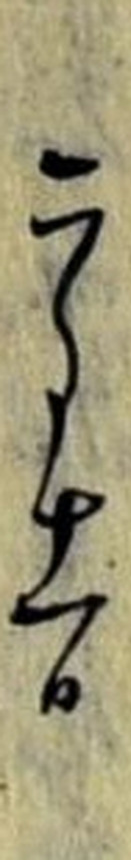二月十一日
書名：命令之部 三
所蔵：福井県文書館 Fukui Prefectural Archives
